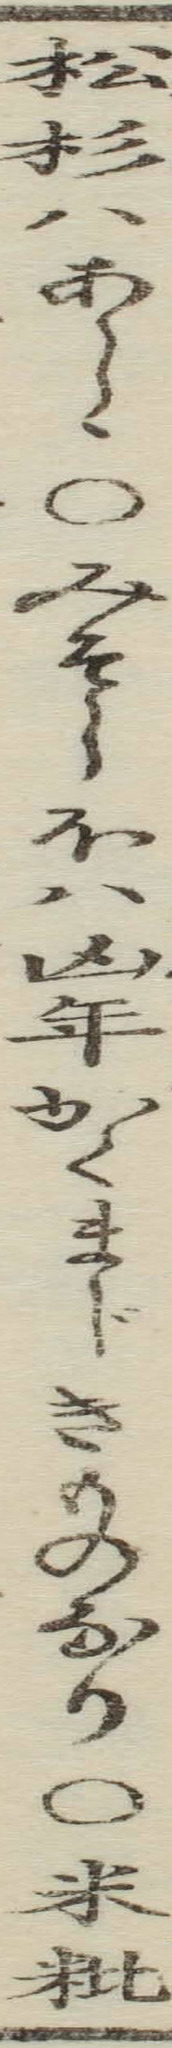松杉はあしゝ○みそしほは凶年かくまじきものなり○米粃
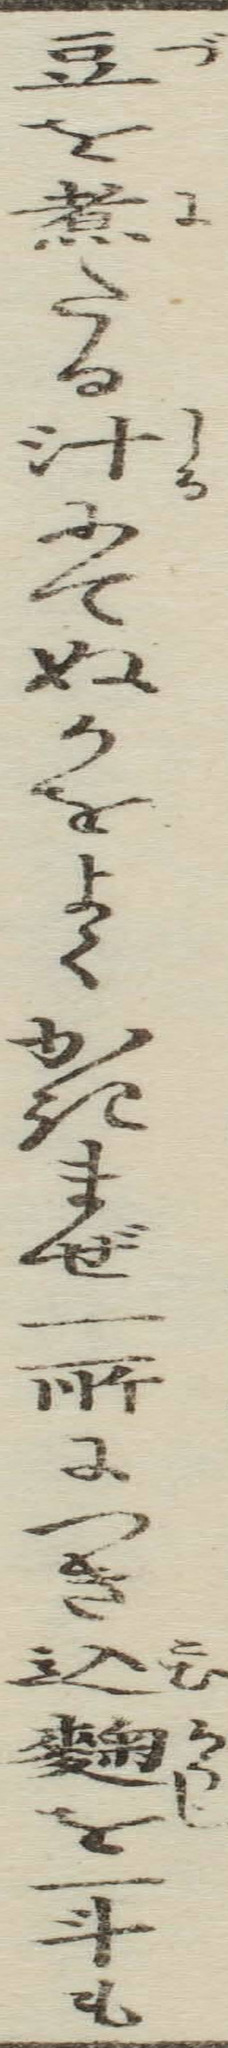豆を煮たる汁にてぬかをよくかきまぜ一所につき込麹を一斗も
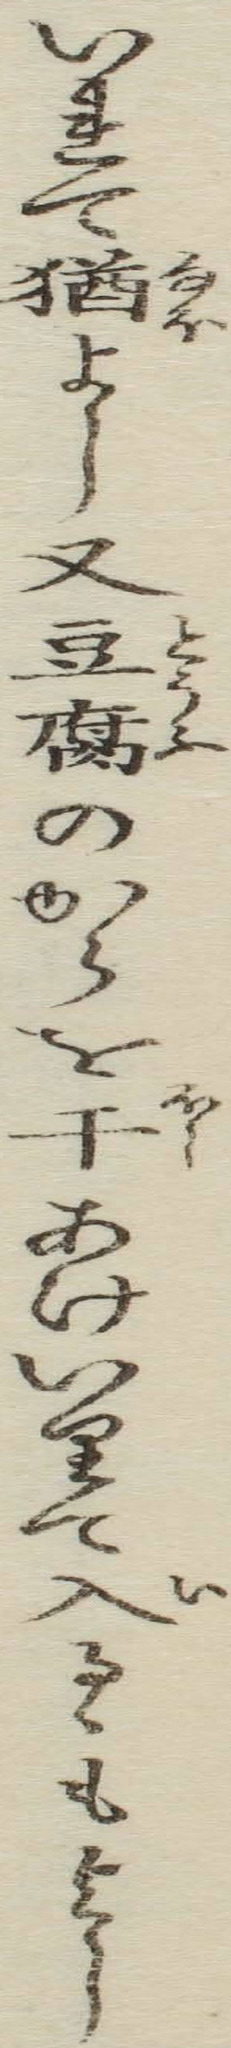いれて猶よし又豆腐のからを干あけいりて入るゝもよし
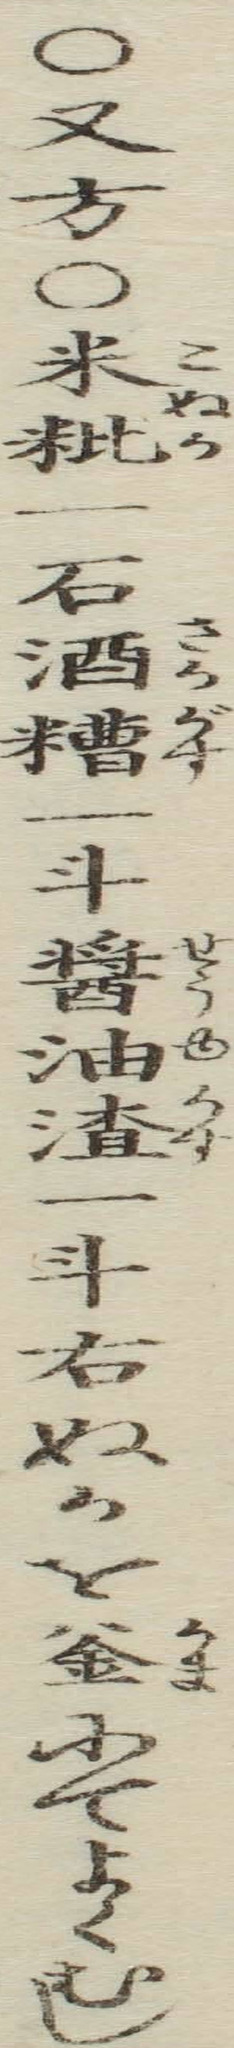○又方○米粃一石酒糟一斗醤油渣一斗右ぬかを釜にてよくむし
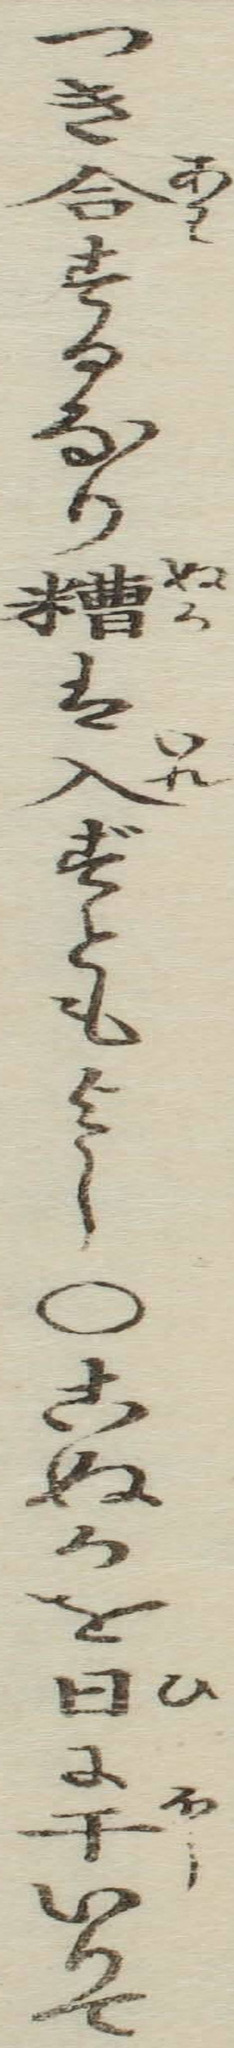つき合するなり糟は入ずともよし○こぬかを日に干いりて

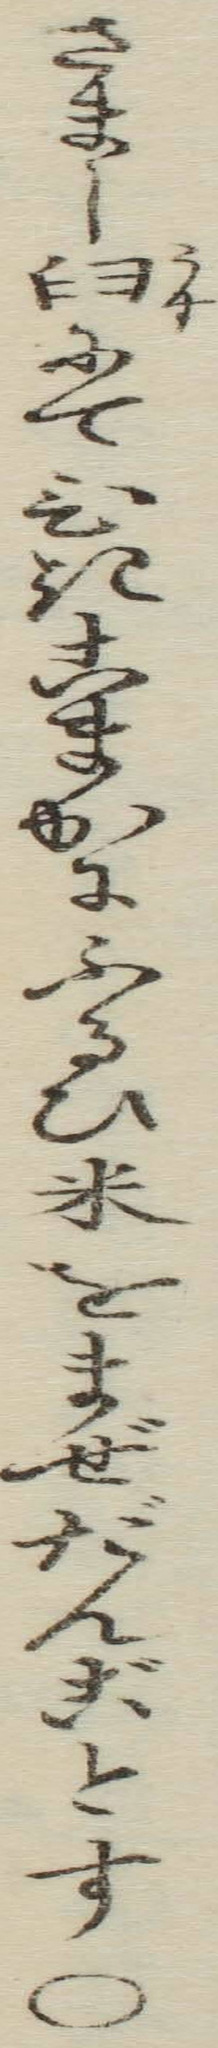さまし臼にてひきこまかにふるひ米をまぜだんごとす○
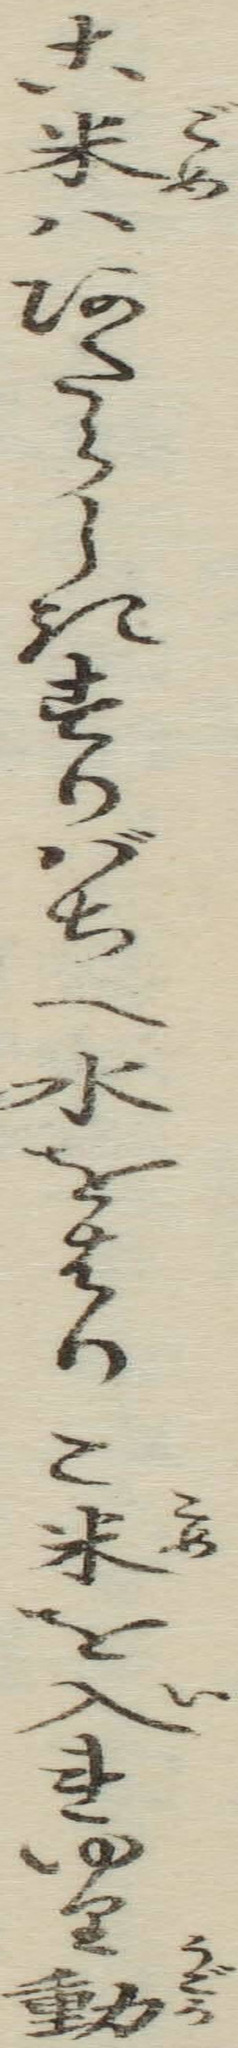こ米はあたらしきすりばちへ水をはりこ米を入れゆり動
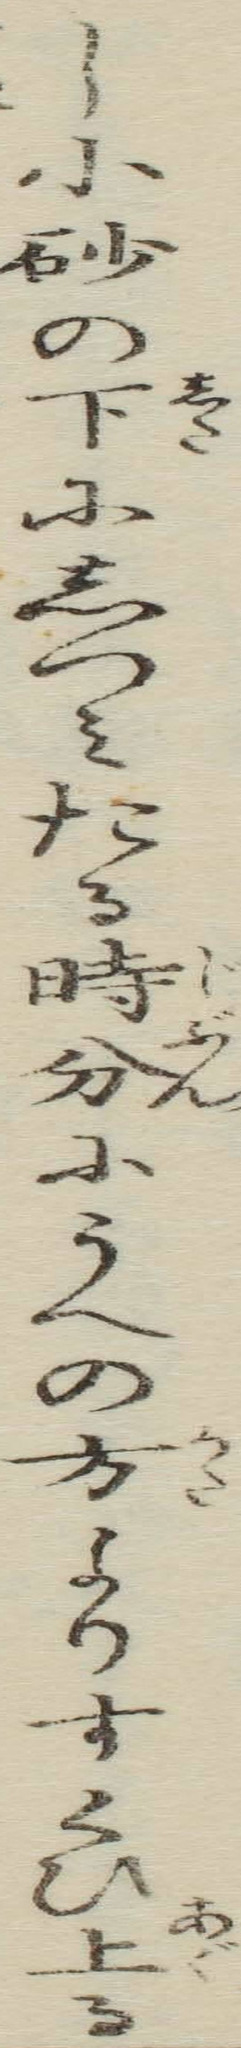し小砂の下にしつみたる時分にうへの方よりすくひ上る
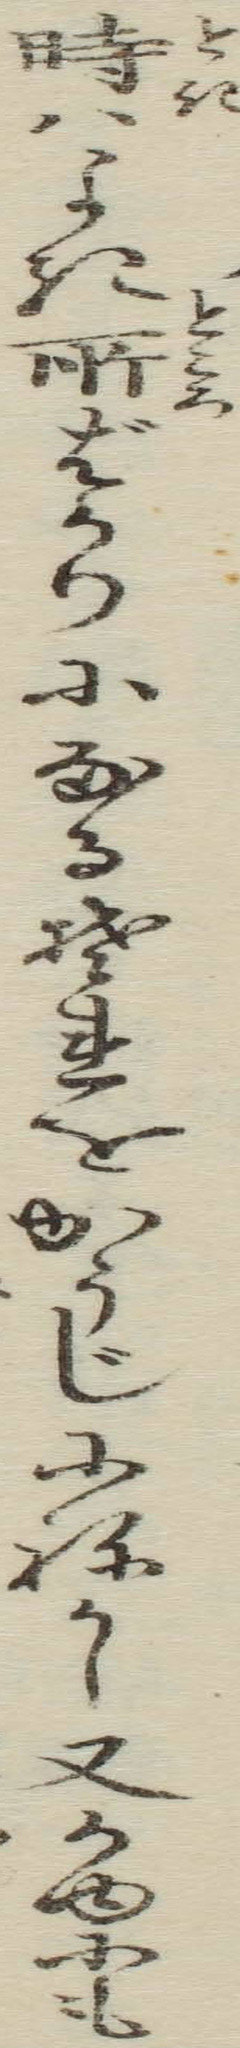時はよき所ばかりになるそれをかうじにねかし又かゆにも
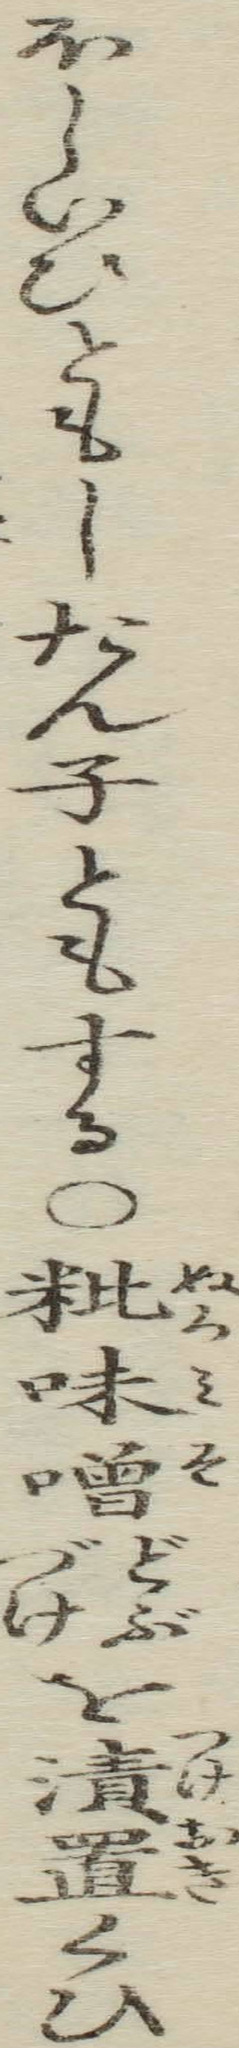ほしいひともしたん子ともする○粃味噌どぶづけを漬置くひ
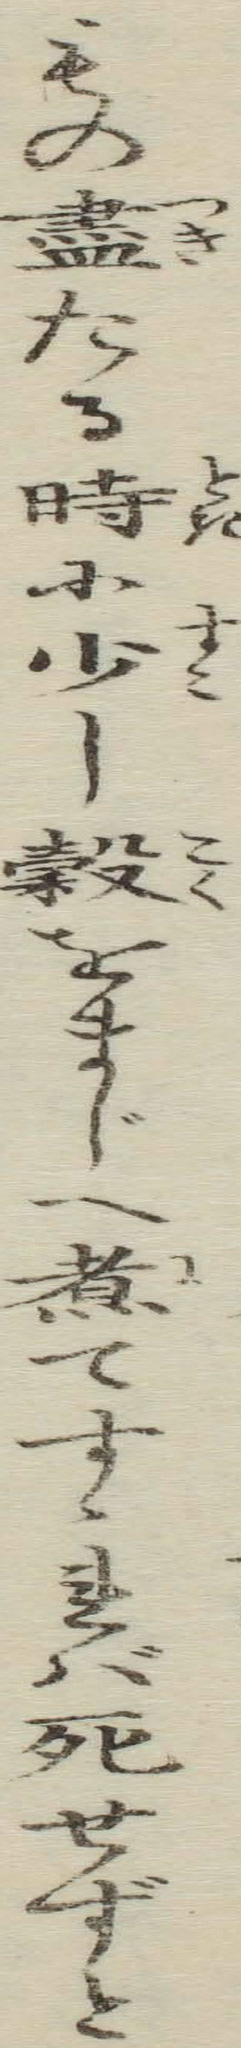もの尽たる時に少し穀をまじへ煮てすゝれば死せずと
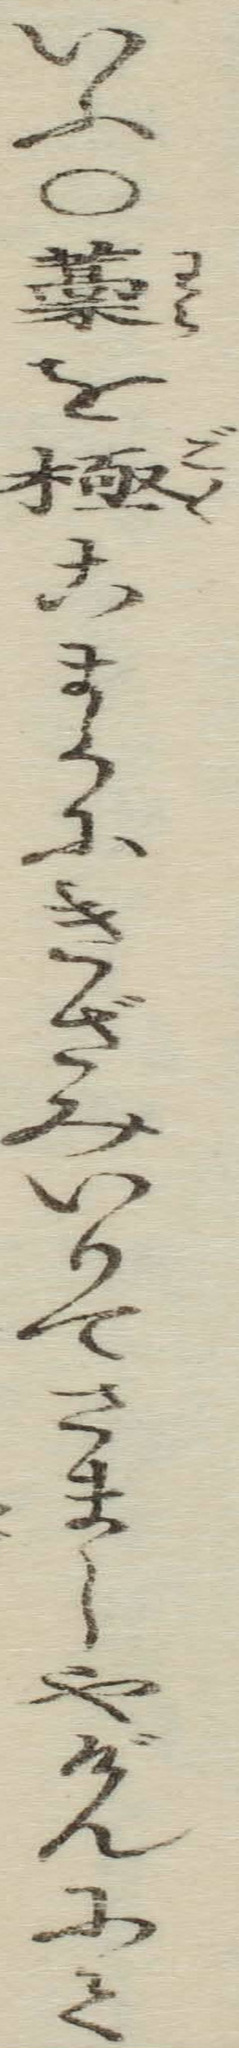いふ○藁を極こまかにきざみいりてさましやげんにて
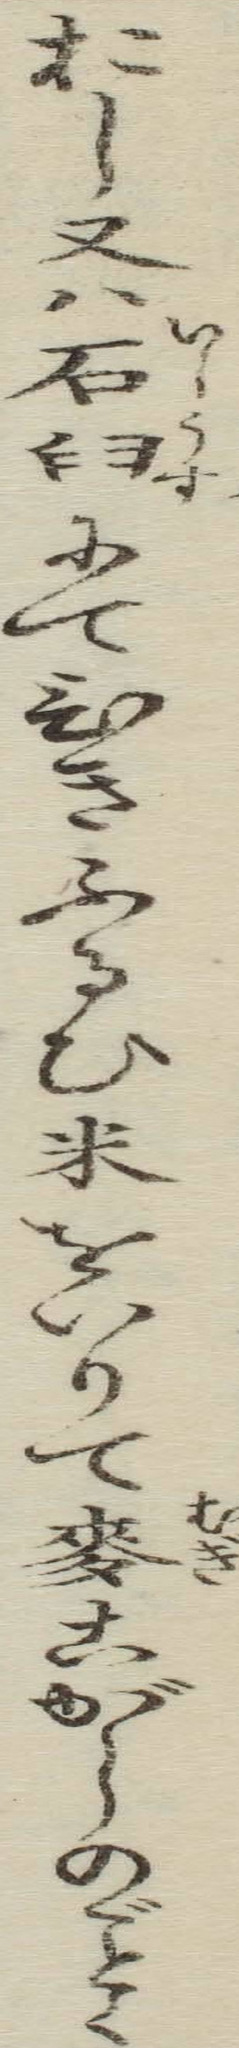おし又は石臼にてひきふるひ米をいりて麦こがしのごとく
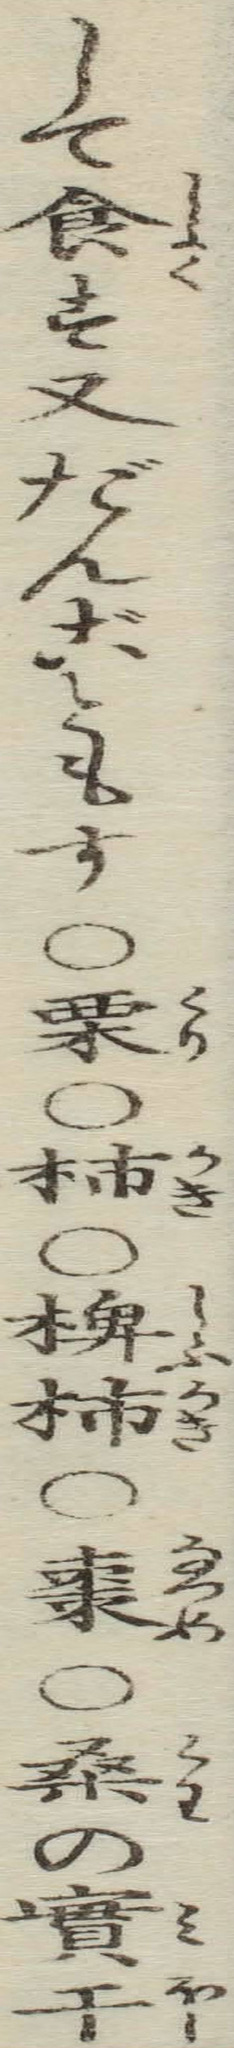して食す又だんごともす○栗○柿○椑柿○棗○桑の實干
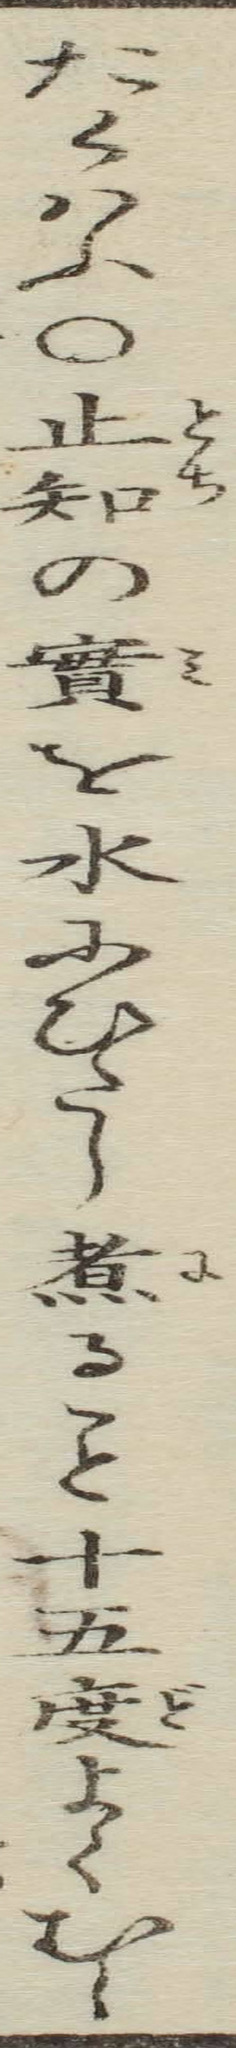たくはふ○止知の實を水にひたし煮ること十五度よくむし
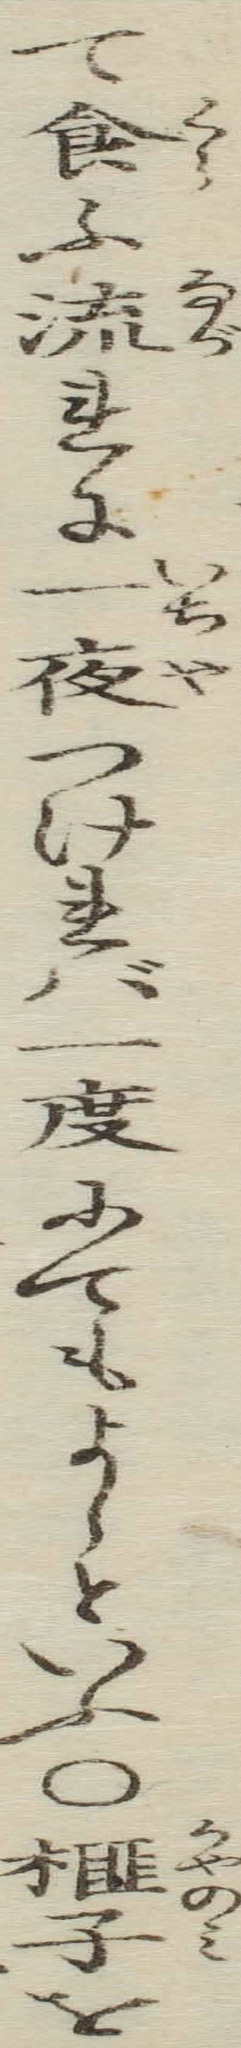て食ふ流れに一夜つければ一度にてもよしといふ○榧子を
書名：救荒便覧
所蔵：国文学研究資料館
